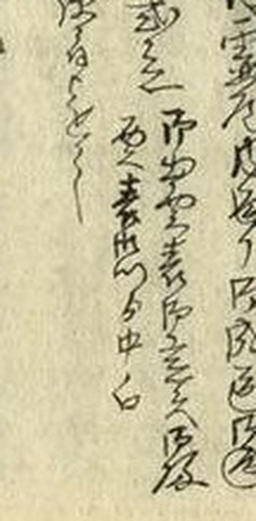殿表御門ゟ中ノ口
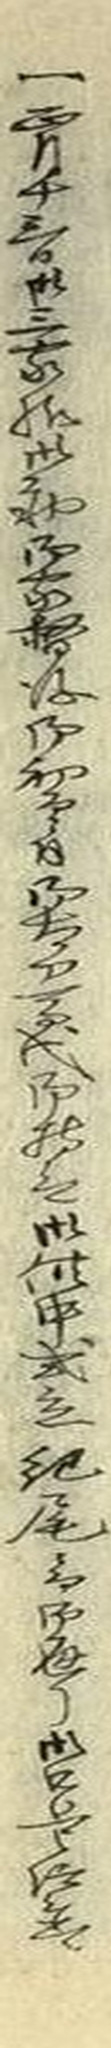一正月十三日御三家様御勤御家督後御初而ニ付御太刀馬代御持参御供中式立紀尾ニ而御通り御口上被仰置候
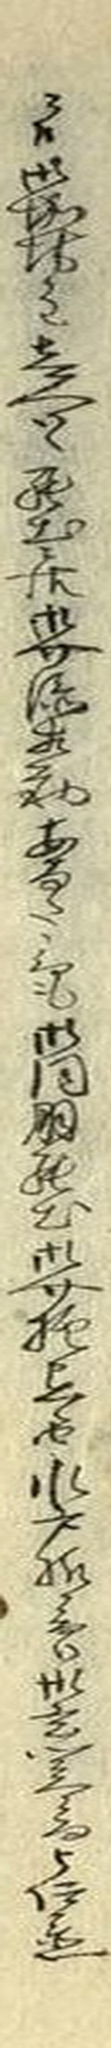ニ付御城坊主壱人ツヽ罷出居御介添相勤あなたニ而も御同朋罷出御介抱申上候由水戸様ニ而ハ御玄関ニ而被仰置
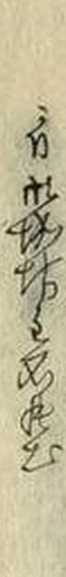ニ付御城坊主不罷出
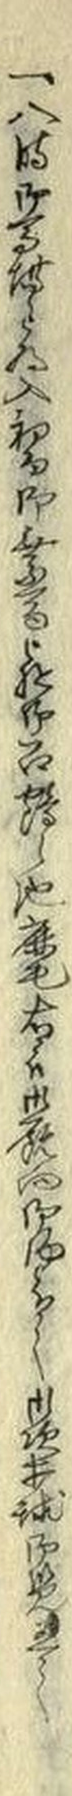一八時御馬場へ被為入初而御乗馬被遊御召鶴之池鹿毛右ニ付御厩向御酒被下之御次打毬御覧有之
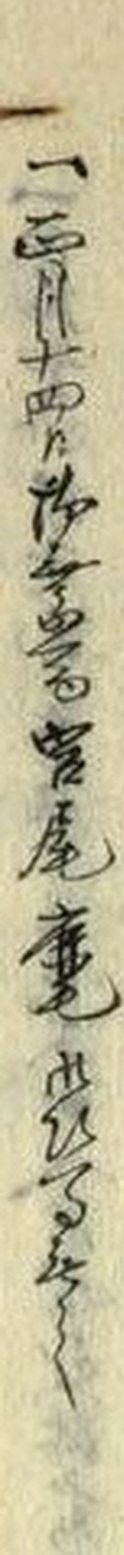一正月十四日御乗馬宮尾鹿毛御次馬無之
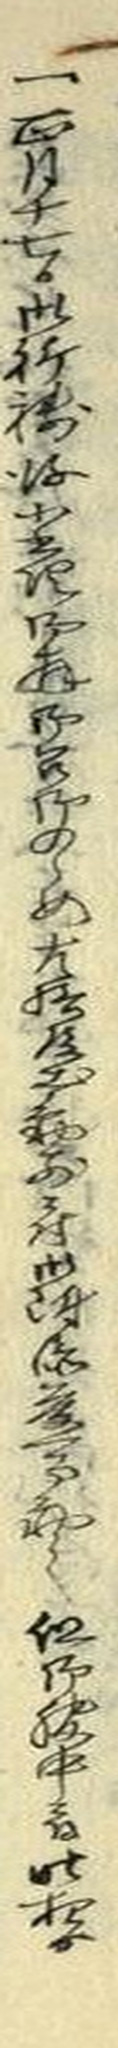一正月十七日御祈祷後小書院御拝御召御のしめ左膳殿出勤前ニ付御附添藤馬勤之但御服中ニ付昨夜ゟ
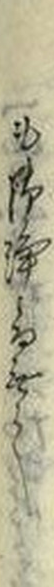も御浄ニ而無之
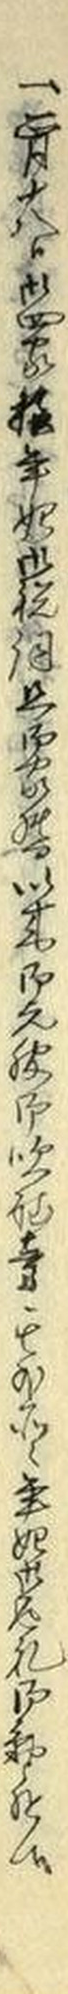一正月十八日御四家様年始御祝詞且御家督以来御元服御吹聴旁其外所々年始御返礼御勤被遊候
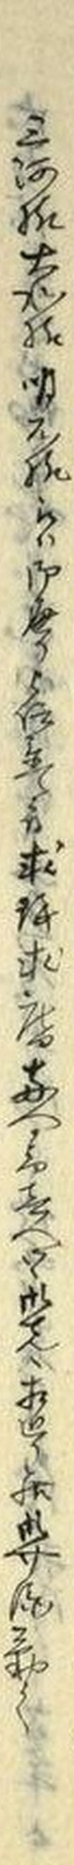三河様大和様明石様江ハ御通り被仰置候ニ付求珉求庵両人ニ而壱人ツヽ御先へ相廻り居御介添勤之
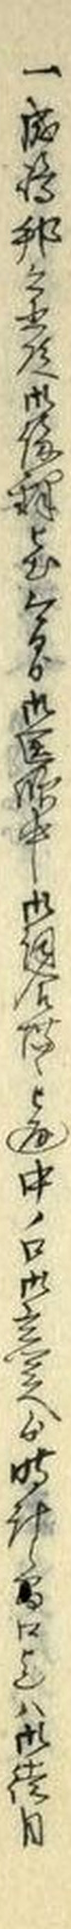一成嶋邦之丞殿御講釈被出今日ゟ御医師中御調合場へ被通中ノ口御玄関ゟ時計之間口迄ハ御徒目
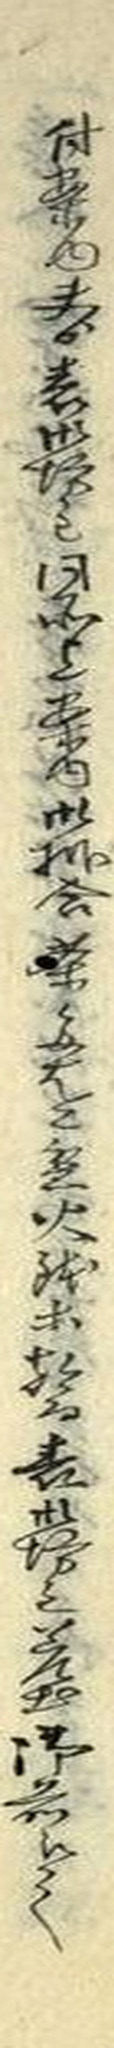付案内夫ゟ表御坊主同所迄案内御掛合茶たはこ盆火鉢等都而表御坊主差出御前江之
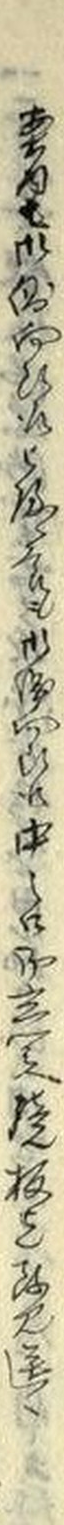案内者御側向頭取被帰候節も御側向頭取中之口御玄関鏡板迄致見送候
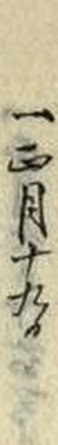一正月十九日
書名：少傅日録抄（斉善付側向頭取日記、在府）
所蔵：福井県文書館 Fukui Prefectural Archives
